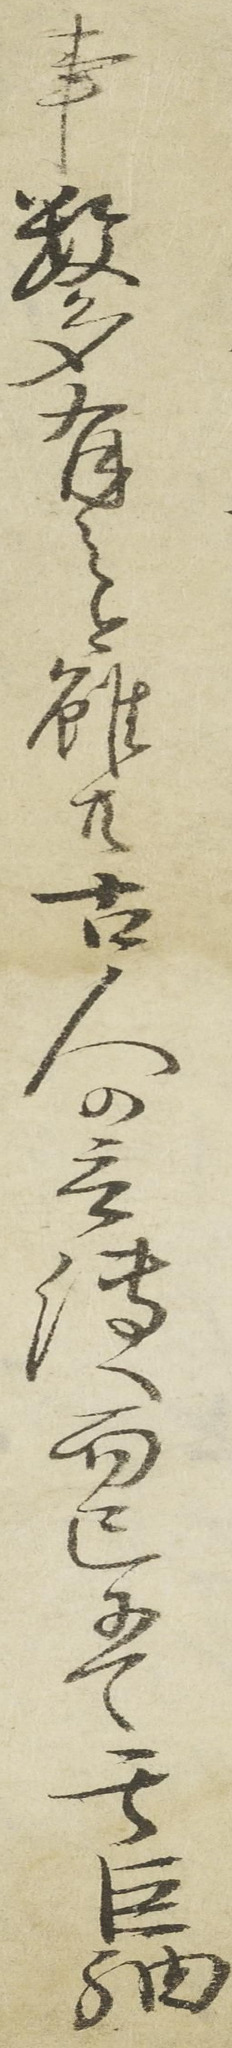事数多有之と雖共古人の言伝へ而已にて其巨細
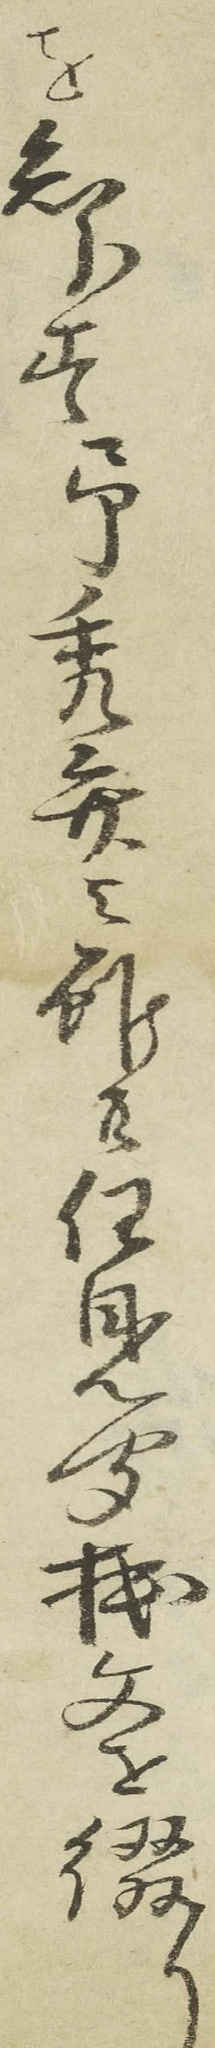を知らす予禿弁と雖共任見聞拙文を綴り
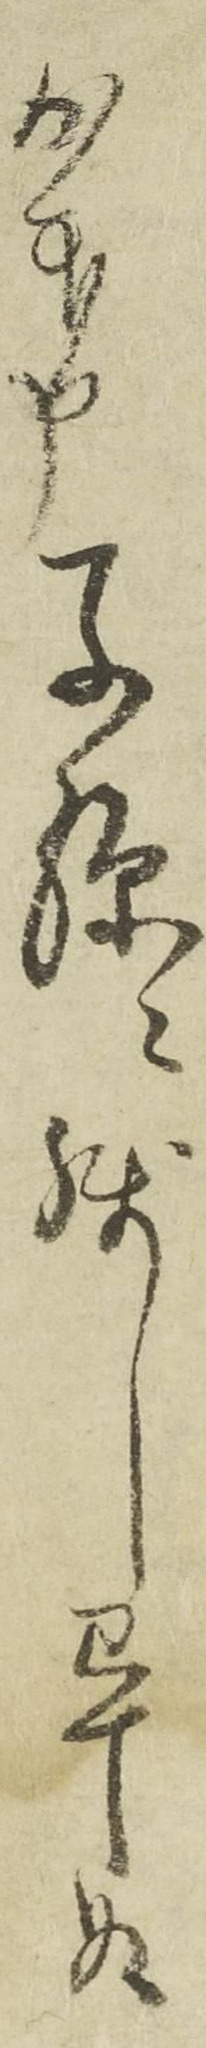かき申子孫に残し畢ぬ
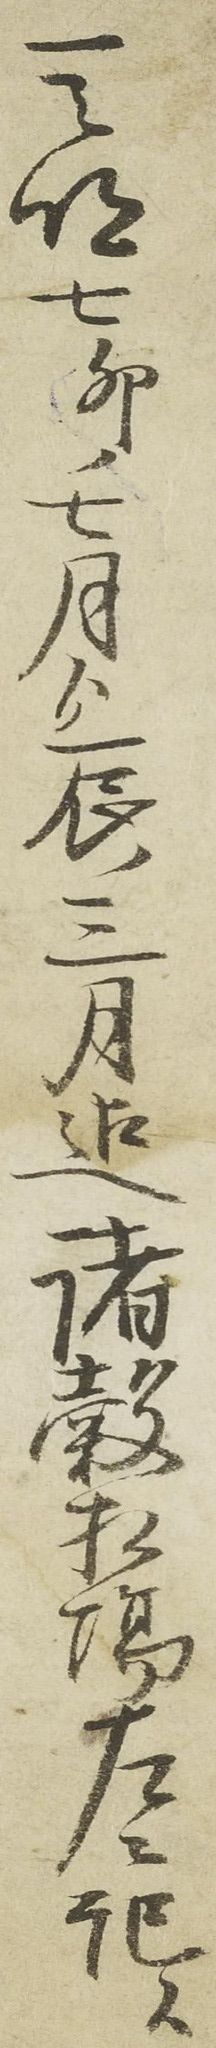天明七卯ノ七月ゟ辰三月迄諸穀相場左ニ記ㇲ
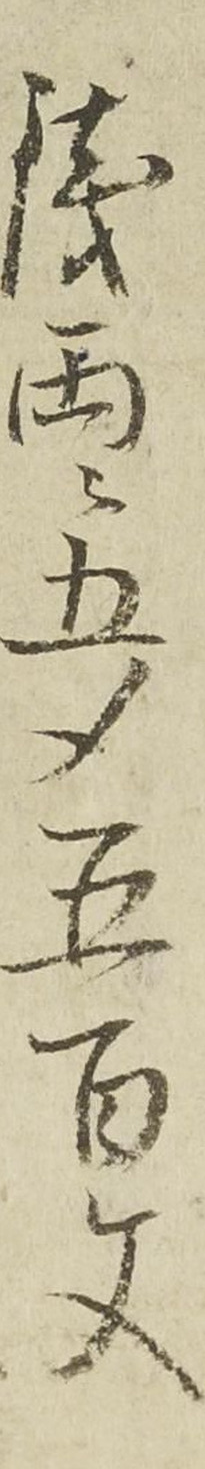銭両ニ五貫五百文
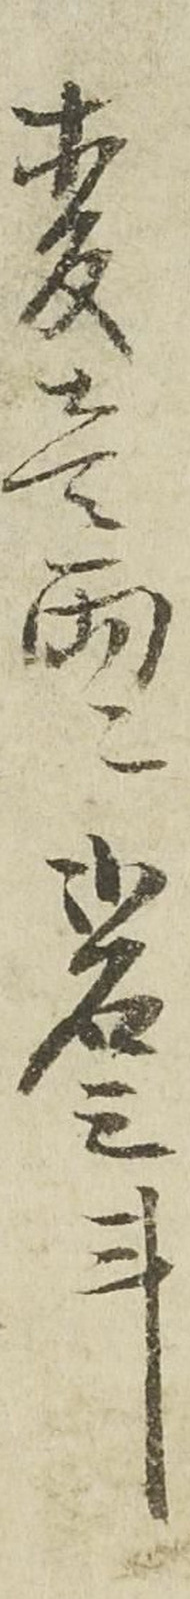稗壱両ニ弐石九斗
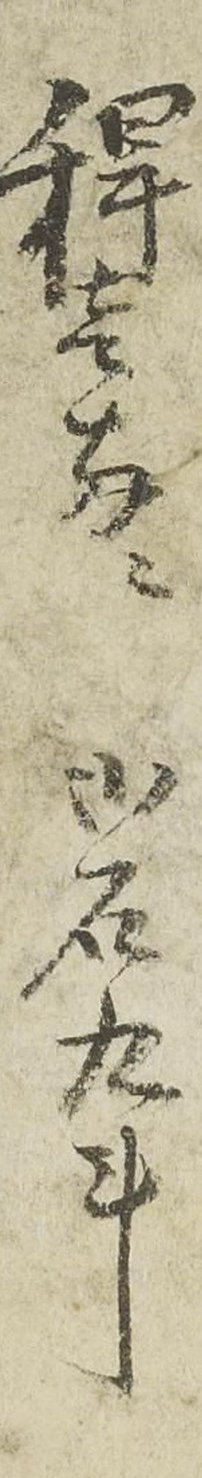稗壱両ニ弐石九斗

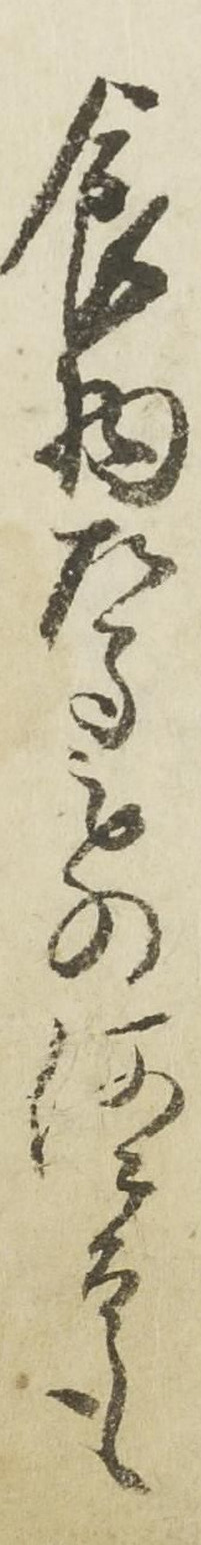食物たるもの何ニ而も
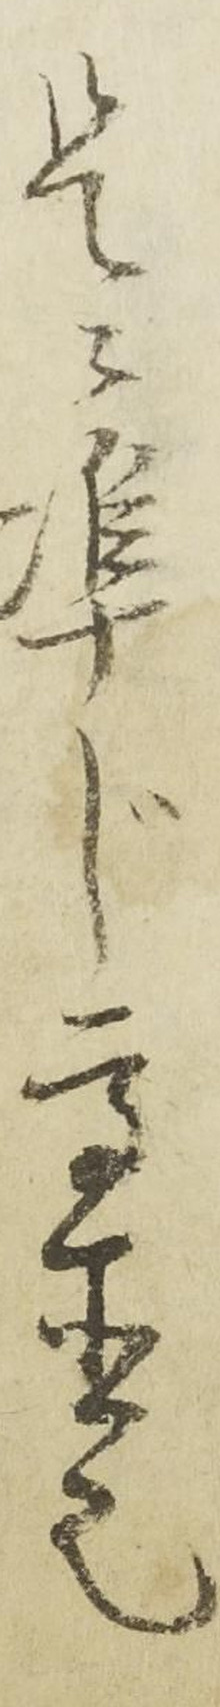是ニ準じ高直也
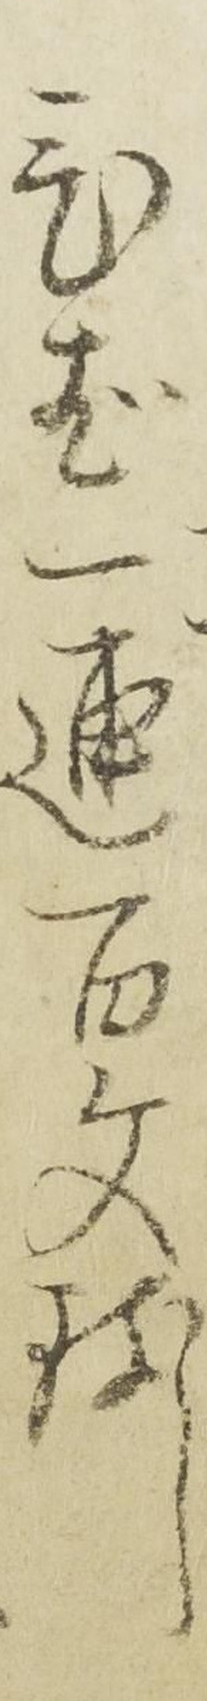ひば一連百文致し
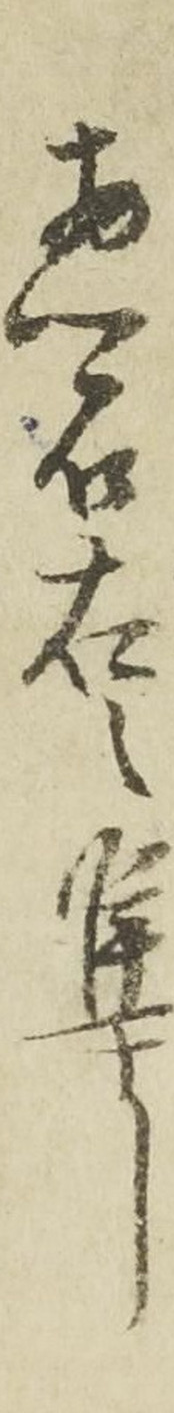惣石右之準す
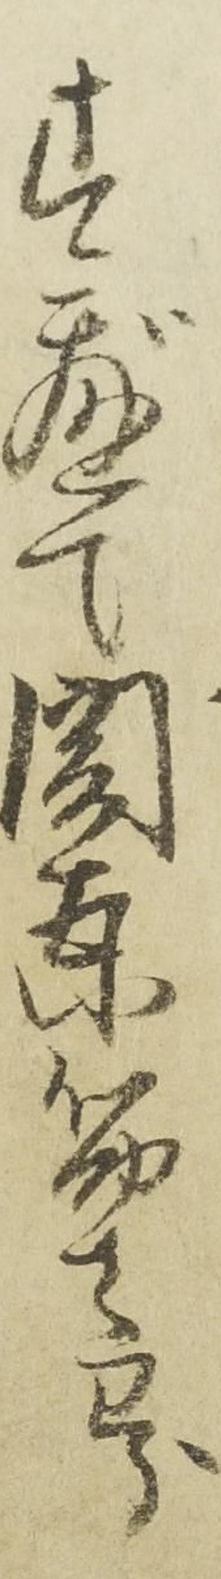すべて関東筋はわら
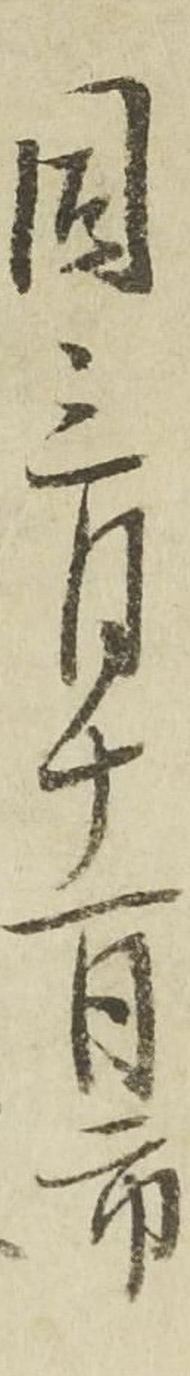同三月十一日市
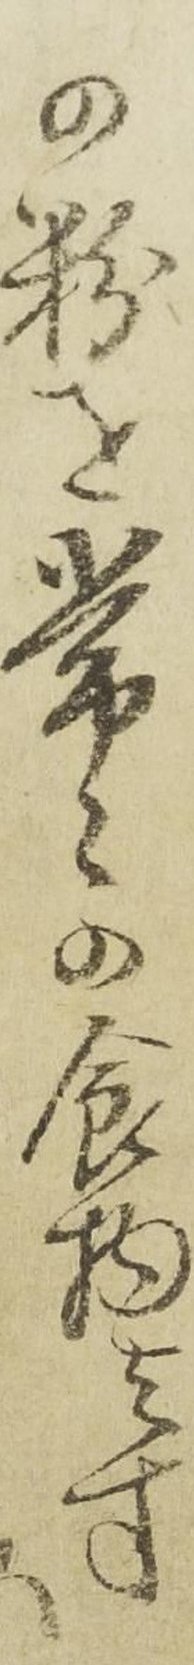の粉を常々の食物とす
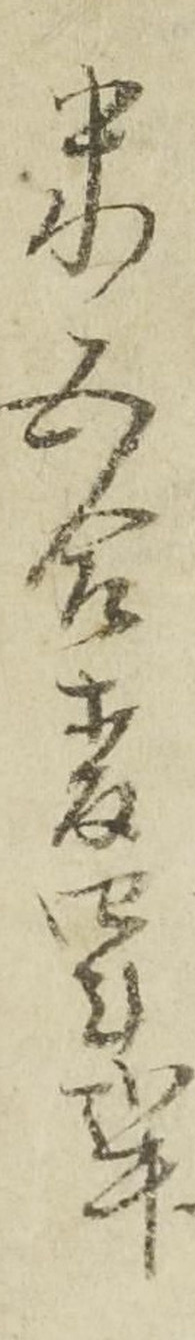米五合麦四斗弐升
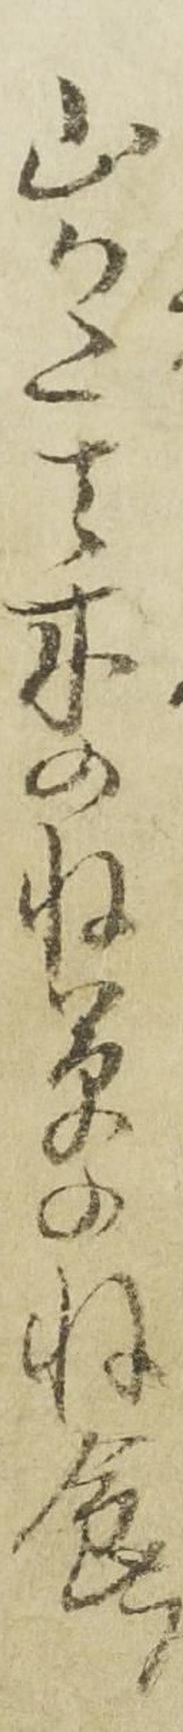山かたは木のね草のね食ス
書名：浅間大変略記
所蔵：東京大学地震研究所図書室 Earthquake Research Institute Library, The University of Tokyo, JAPAN
